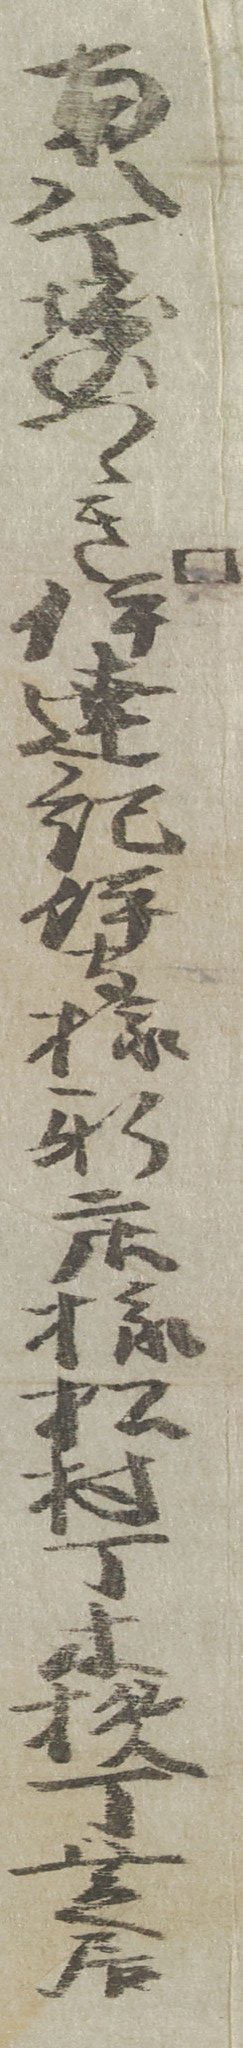南八丁堀のつゝき伊達紀伊守様新店様松村丁木挽丁芝居
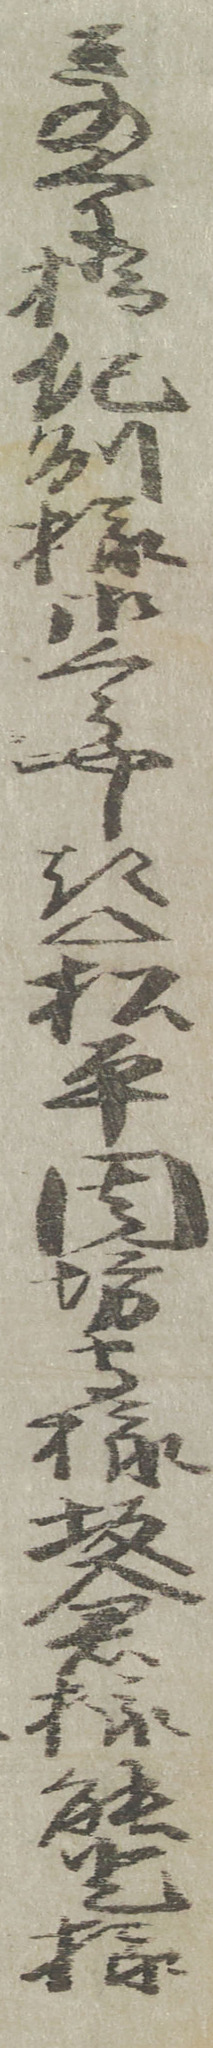きのくに橋紀州様御くらやしき△松平周防守様坂倉様能登様
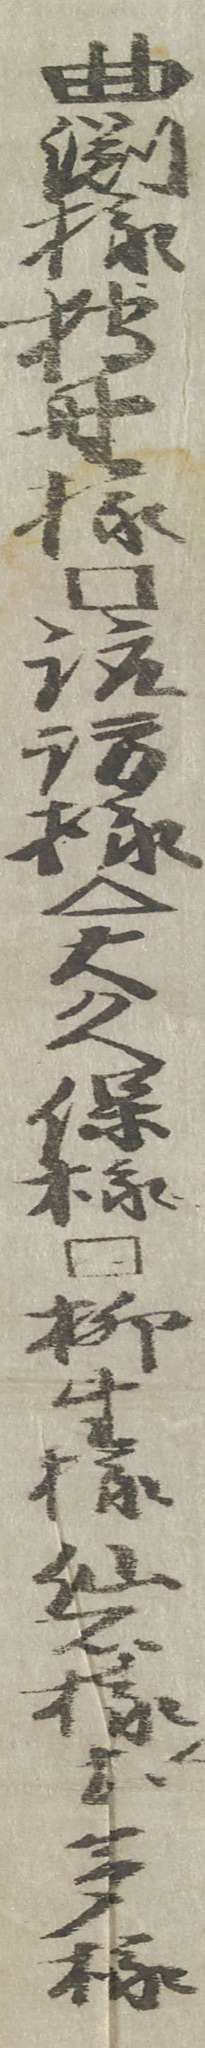曲渕様狩野様諏訪様△大久保様柳生様仙石様△本多様
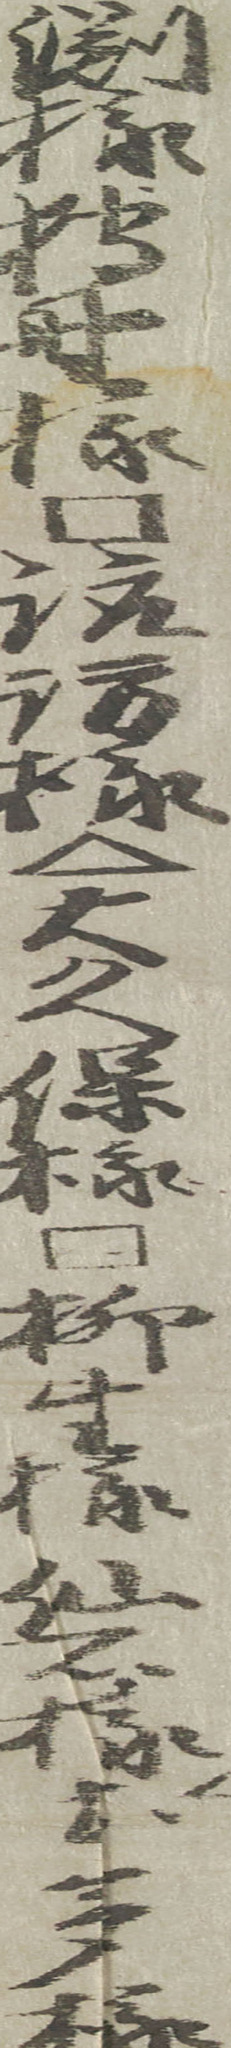曲渕様狩野様諏訪様△大久保様柳生様仙石様△本多様
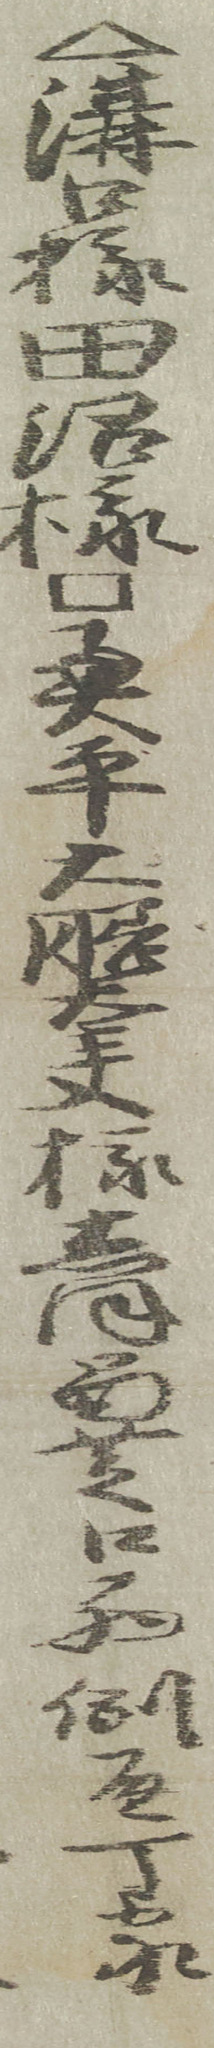△溝口様田沼様奥平大膳大夫様しほ留芝口西側通丁
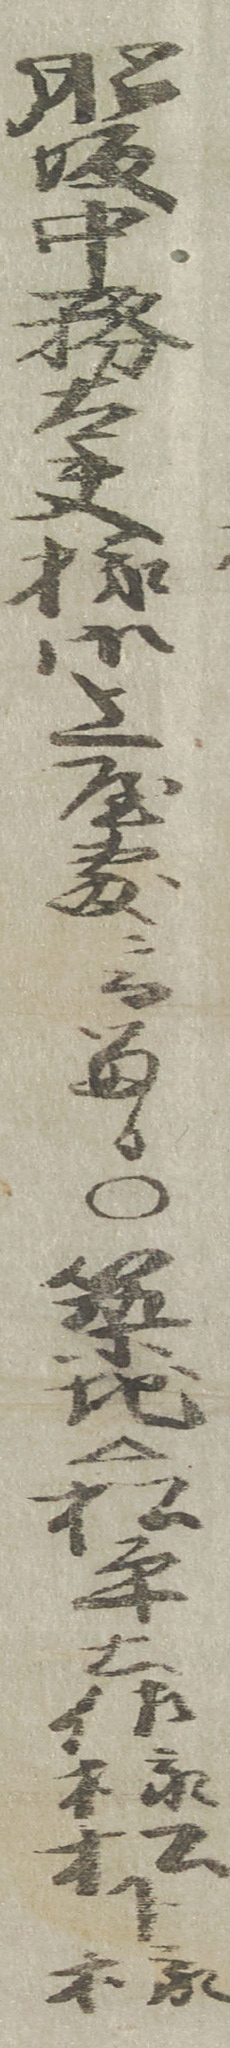脇坂中務太夫様御上屋敷ニ而留る◯築地△松平土佐様松下様
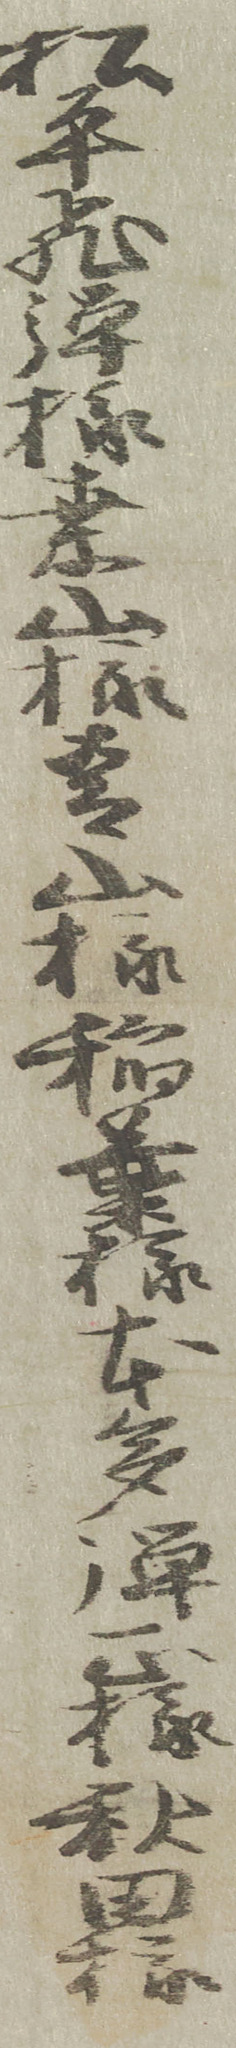松平飛騨様桑山様青山様稲葉様本多弾正様秋田様
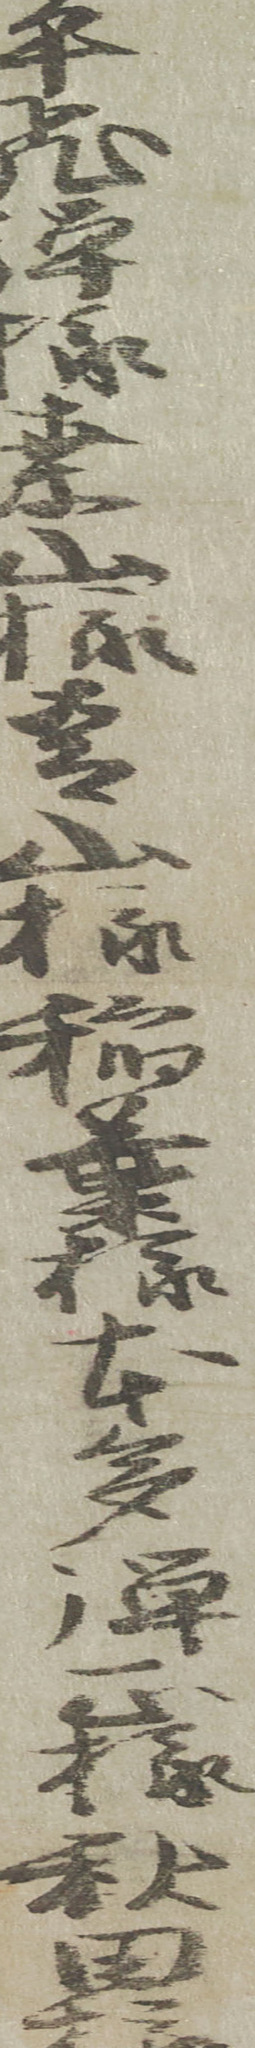松平飛騨様桑山様青山様稲葉様本多弾正様秋田様
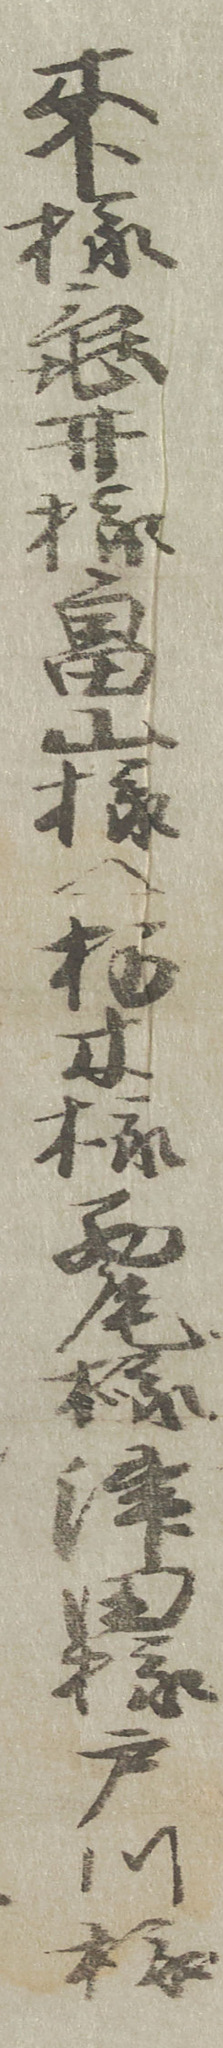木下様亀井様畠山様△栃木様西尾様津田様戸川様
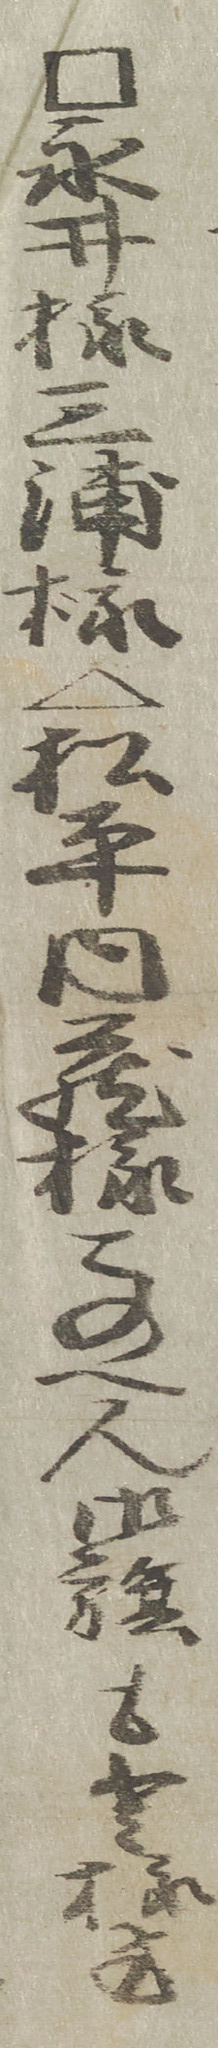永井様三浦様△松平内蔵様このへん御旗もと様方
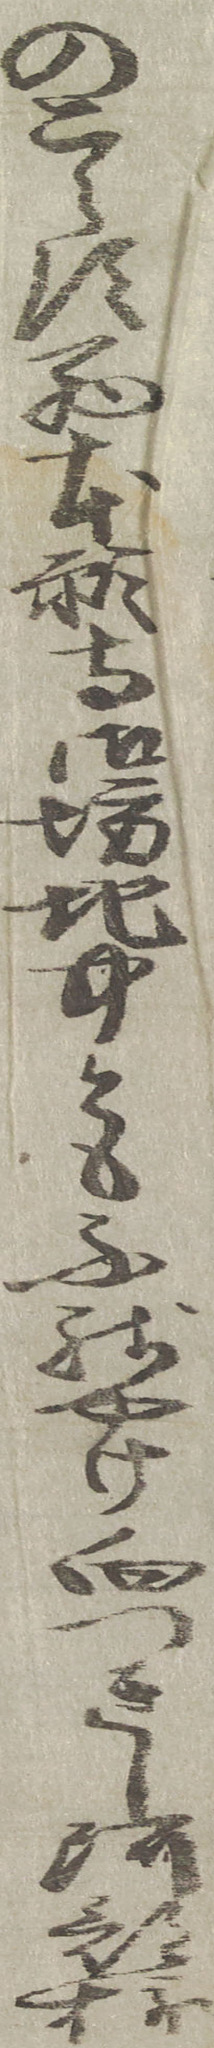のこらす西本願寺御坊地中とも不残やけ向つきし阿部様
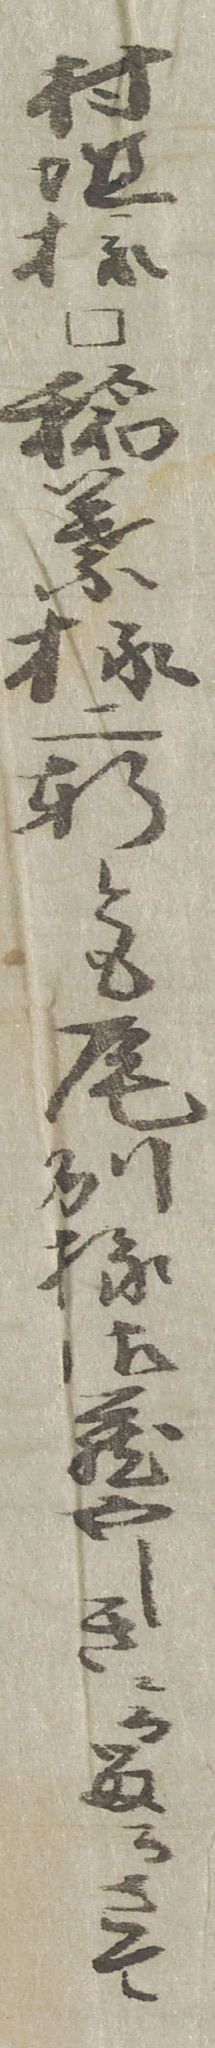村垣様稲葉様二軒とも尾州様御蔵やしきニ而留るさて
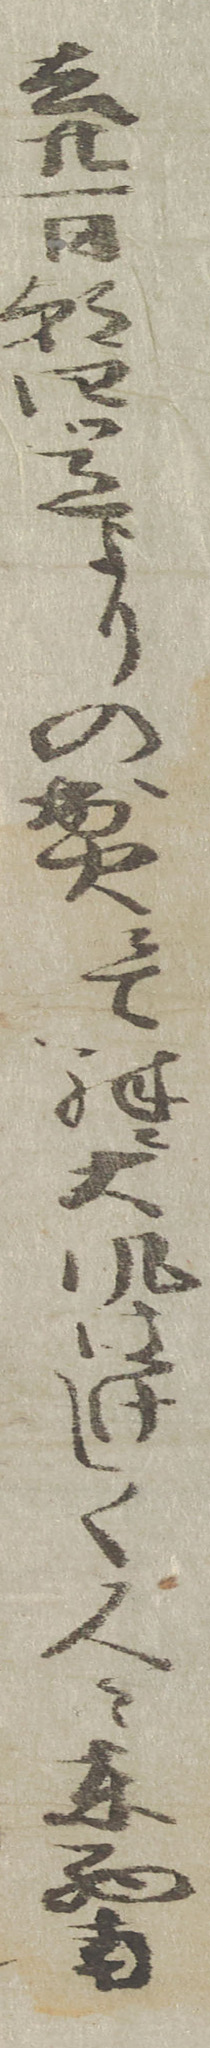去廿一日朝四ツ過よりの出火ニて殊ニ大風はけしく人々東西南
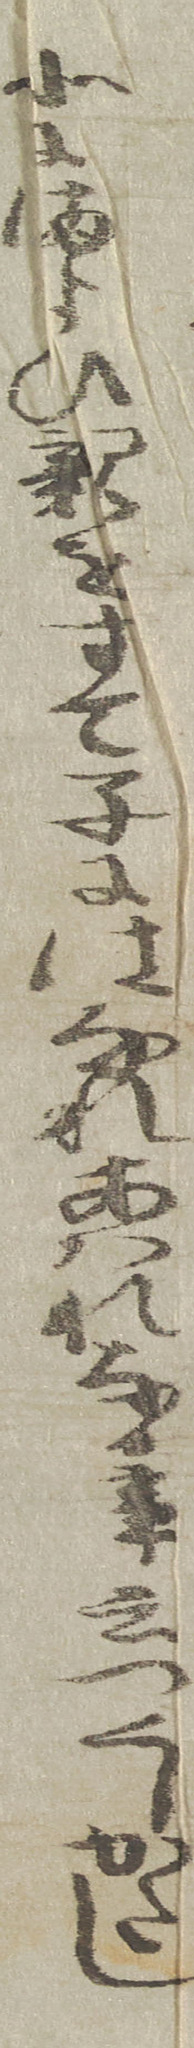北にまよひ親をすて子にはなれあハれなる事云つくしかたし
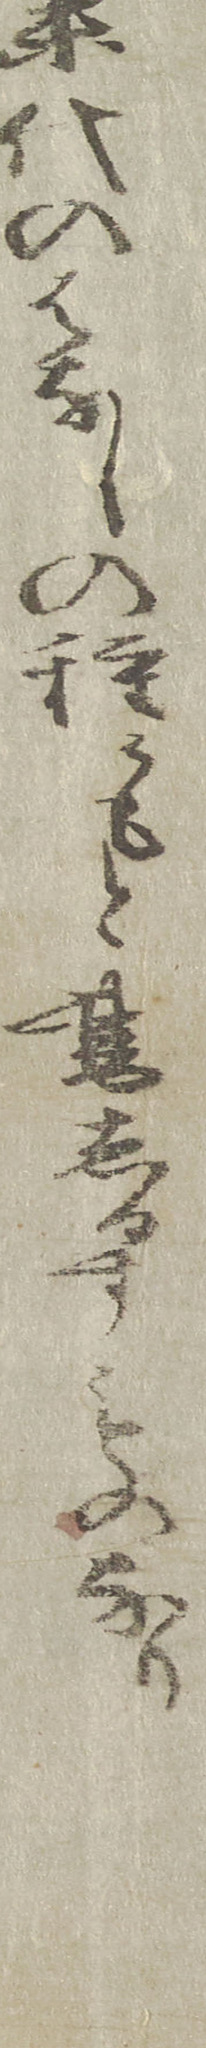末代のはなしの種ニもと書しるすものなり
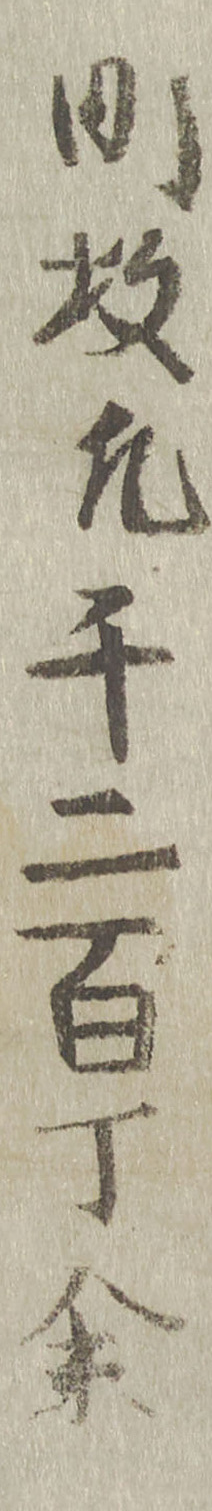町数凢千二百丁余
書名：方角場所附 [江戸大火]
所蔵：東京大学総合図書館 General Library in the University of Tokyo, JAPAN
